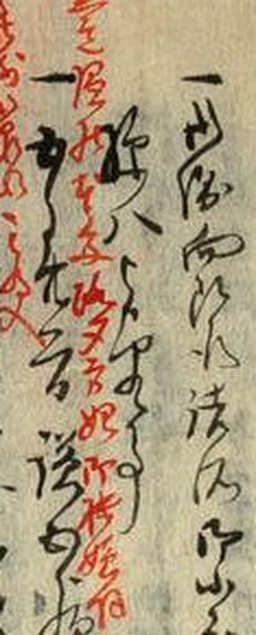孫八被申聞候事
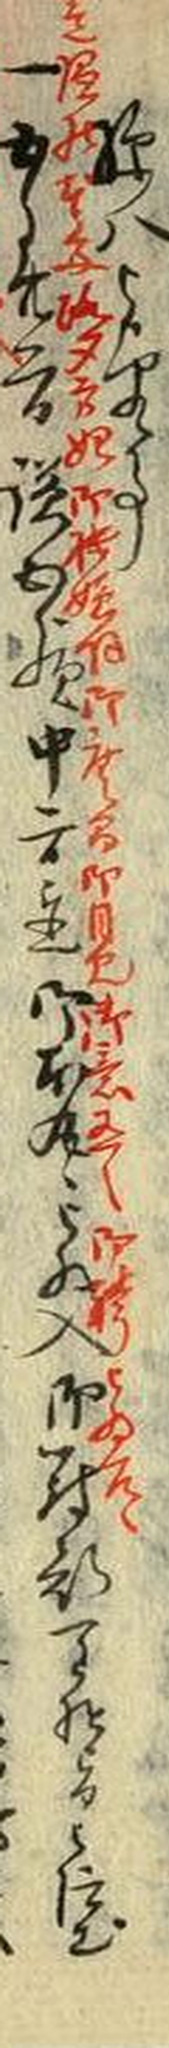一五月廿二日謙五郎様中二日置御本丸へ被為入御対顔可被遊旨被仰出
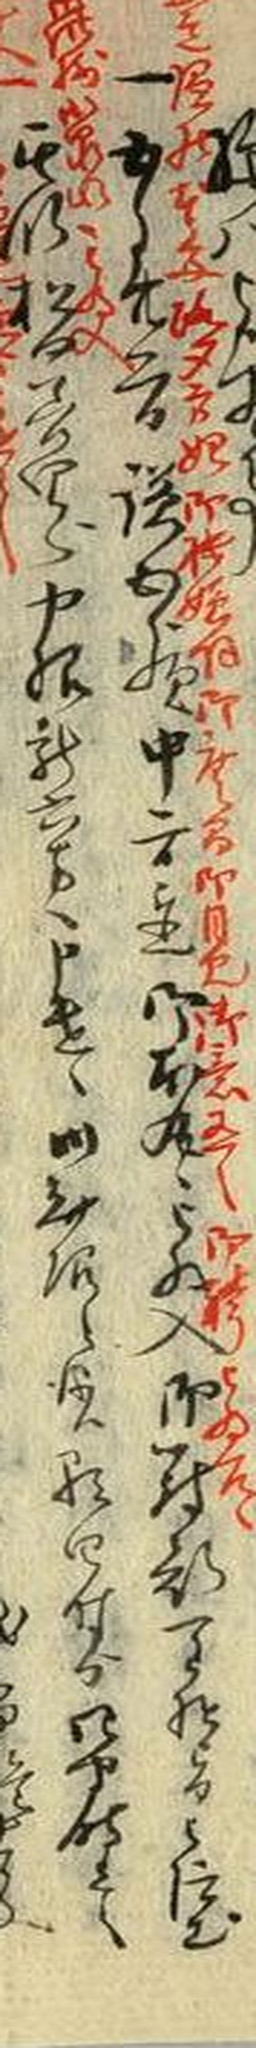其段松田善四郎中根新六方へ申遣候御刻限之儀ハ朝四時ゟ四半時迄之
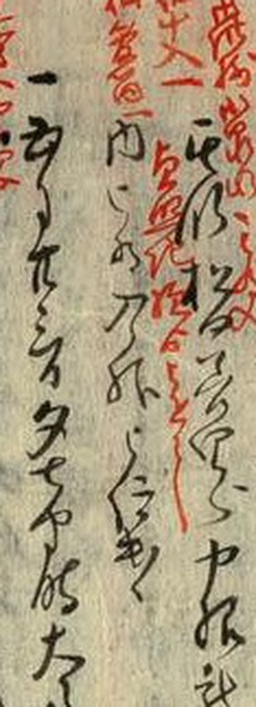間被為入候様被仰出候
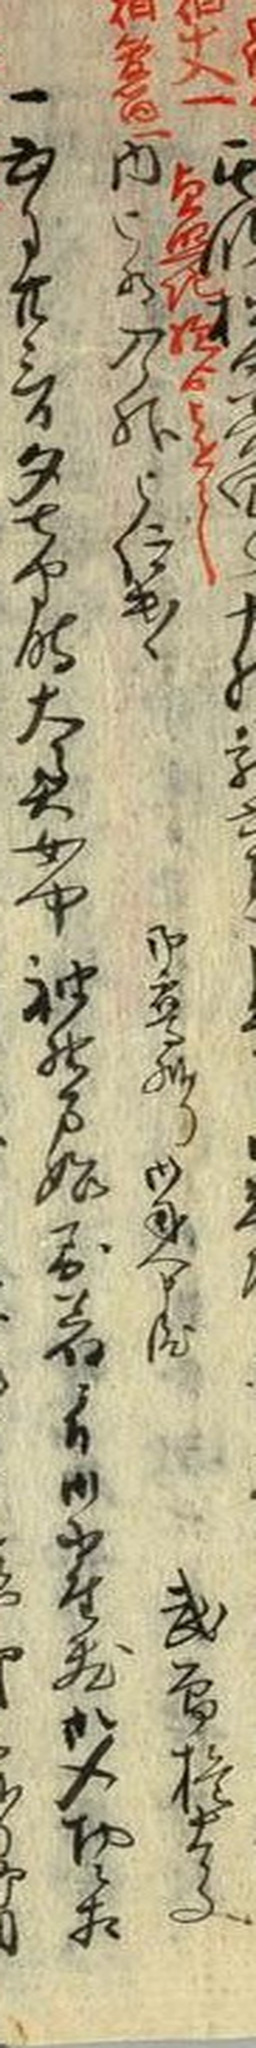一五月廿三日夕七半時大奥女中袖野方始到着ニ付御小座敷御〆切ニ相
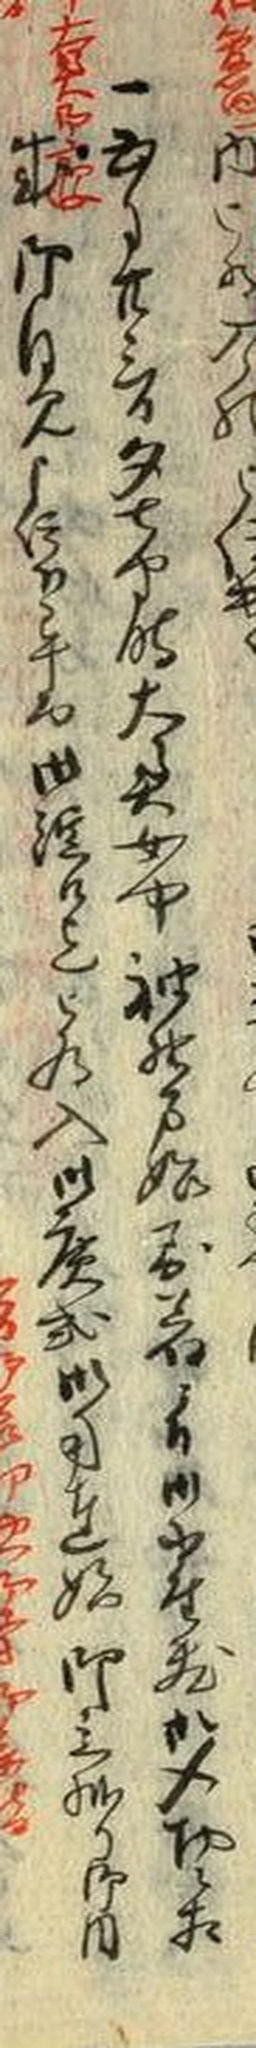成御目見被仰付畢而御錠口迄被為入御広式御用達始御立掛り御目
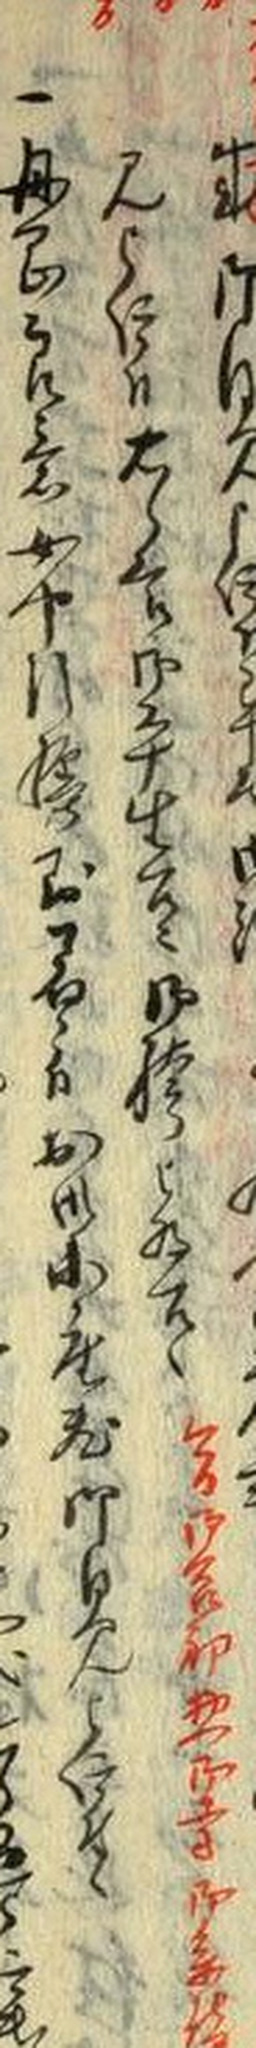一船岡良意女中引纏到着ニ付於御小座敷御目見被仰付候
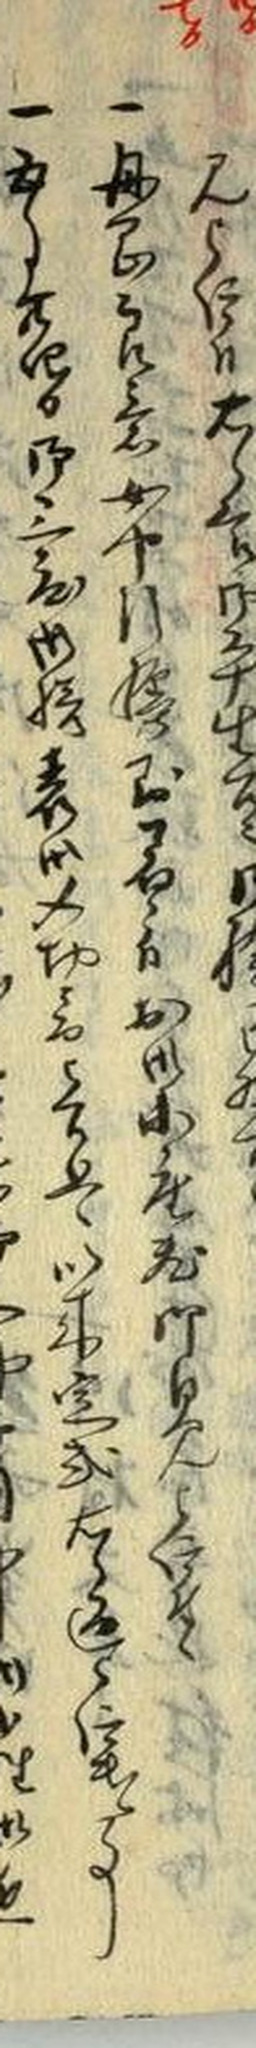一五月廿四日御三度御膳表御〆切ニ而被召上候以来定式右之通被仰出候事
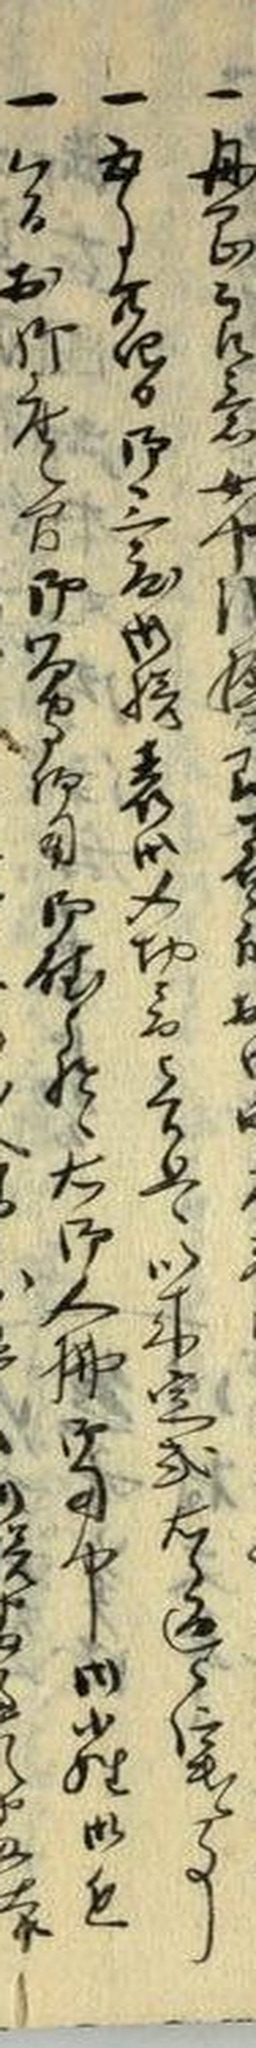一今日於御座之間御留守御用御聴被遊候右御人払御用中御小姓御近
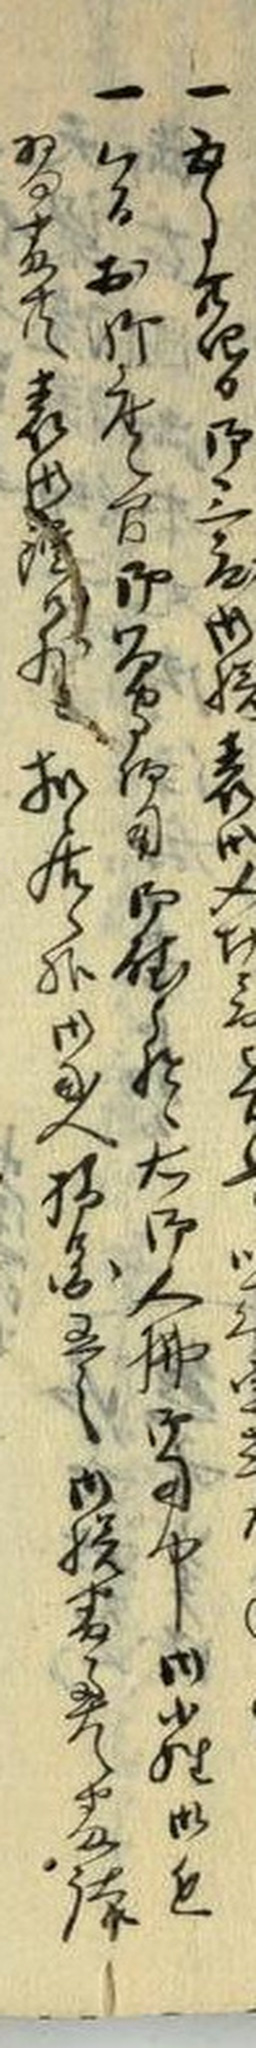習番共表御錠口外ニ控居候様御用人指図有之御膳番奥之番詰
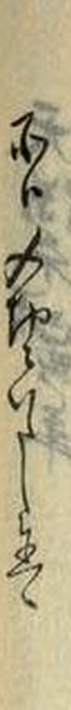所ハ〆切ニいたし置候
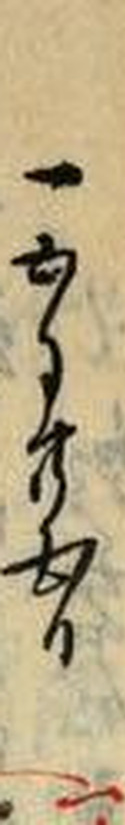一五月廿五日
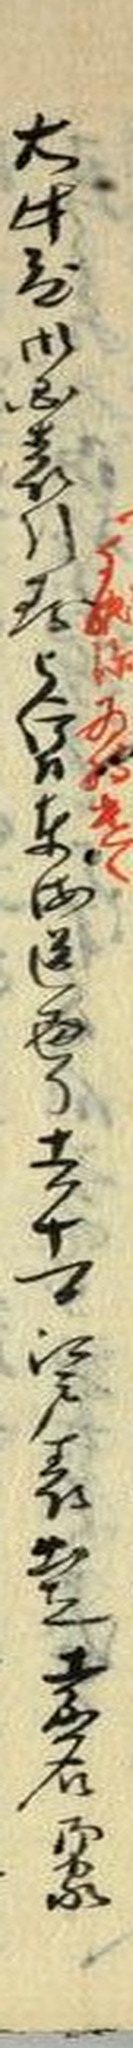右此度御国表引越被仰付東海道通り去十一日江戸表出立桑名御家
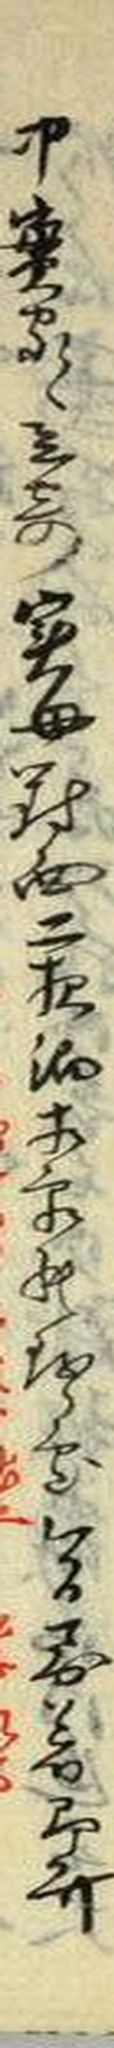中実家へ立寄実母対面二夜泊相願罷越候処今日到着即刻
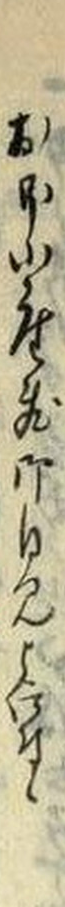於御小座敷御目見被仰付候
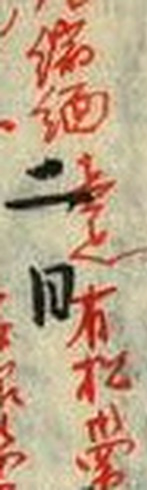廿二日
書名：少傅日録抄（斉承付側向頭取日記、在国）
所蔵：福井県文書館 Fukui Prefectural Archives
